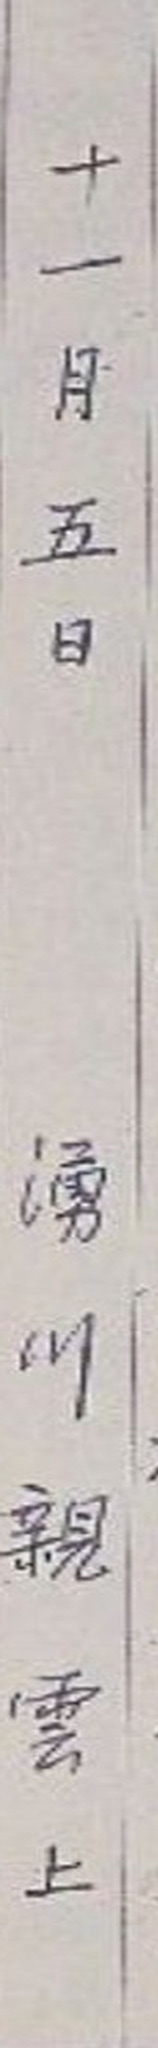十一月五日湧川親雲上
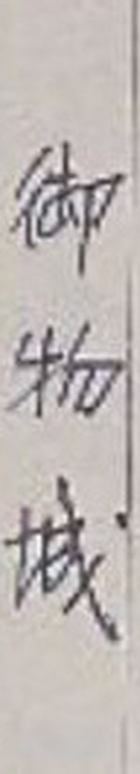御物城
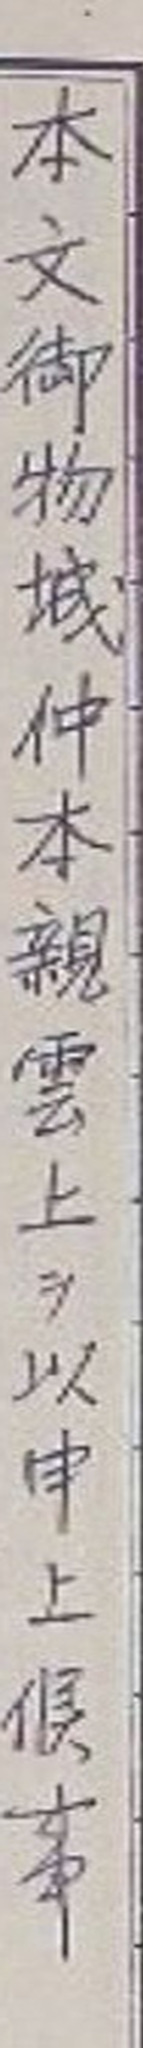本文御物城仲本親雲上を以申上候事
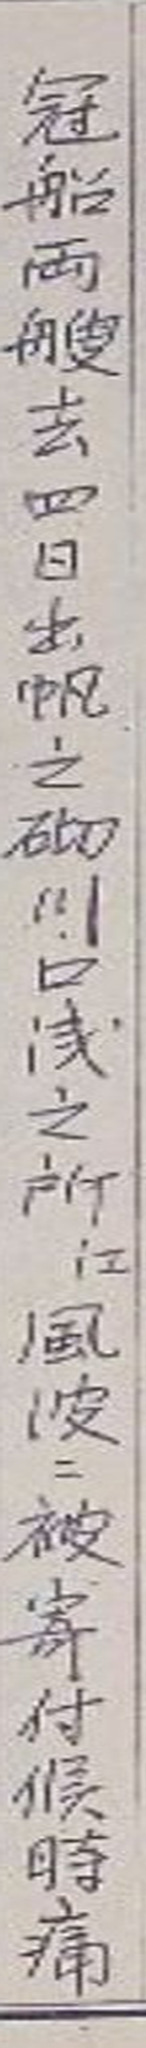冠船両艘去四日出帆之砌川口浅之所え風波に被寄付候時痛
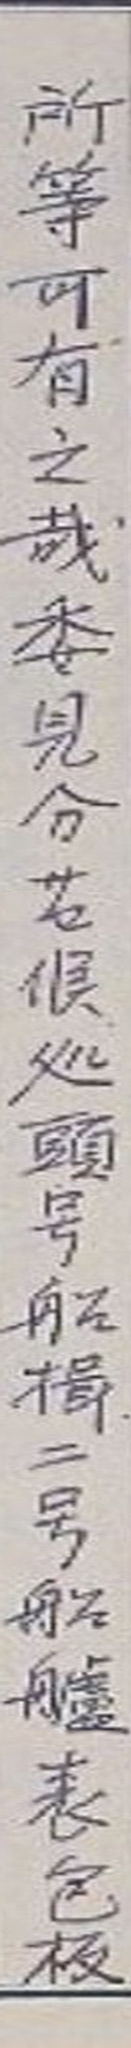所等可有之哉委見分させ候処頭号船楫二号船艪表包板
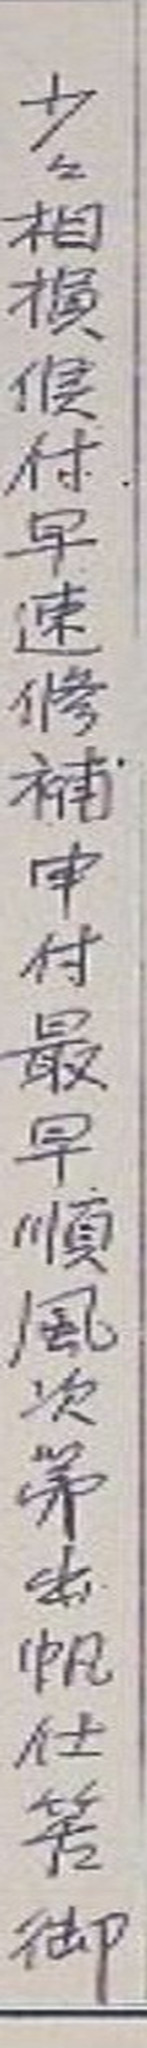少々相損候付早速修補申付最早順風次第出帆仕筈御
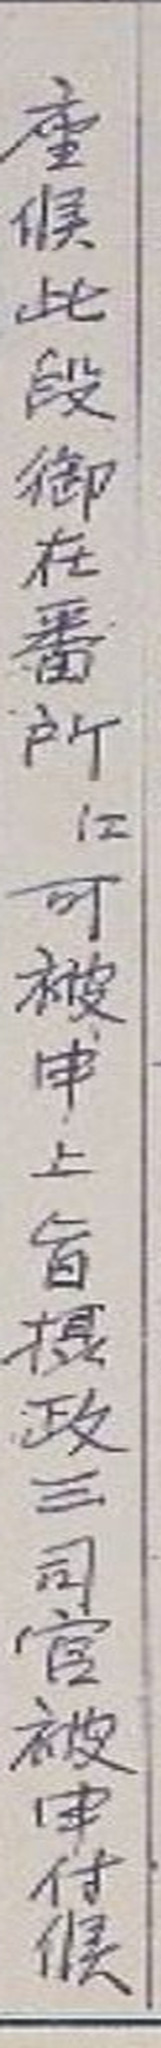座候此段御番所え可被申上旨摂政三司官被申付候
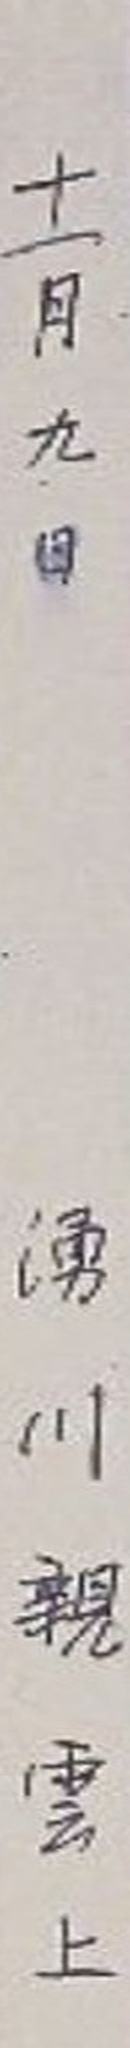十一月九日湧川親雲上
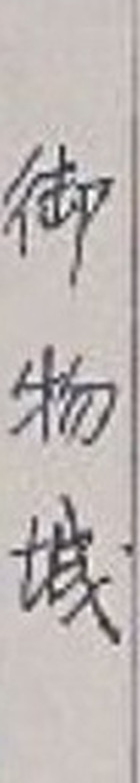御物城
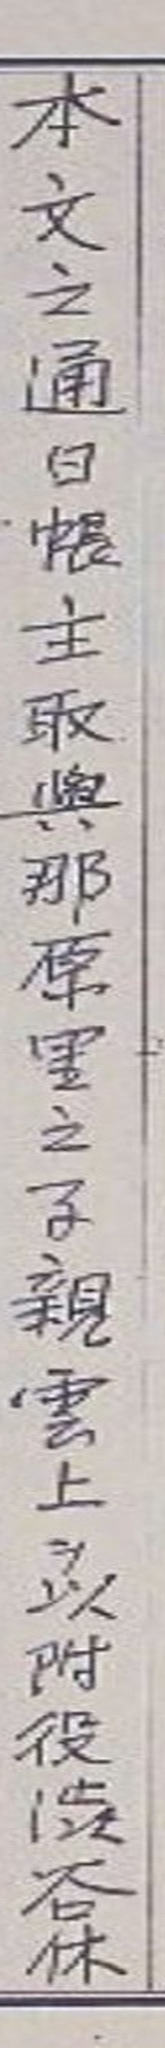本文之通日帳主取与那原里之子親雲上を以附役渋谷休
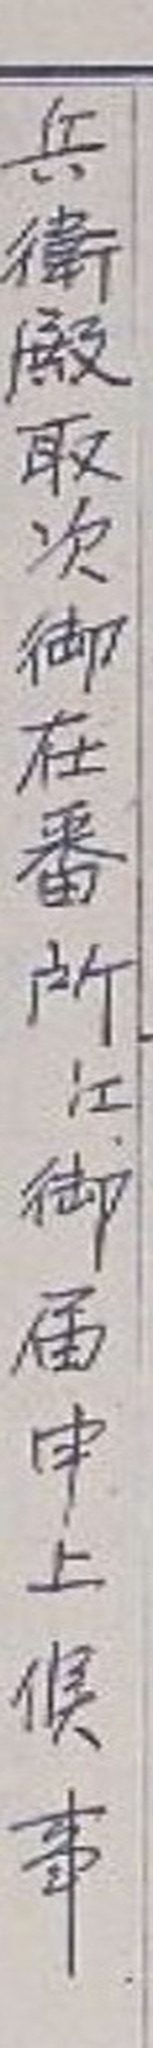兵衛殿取次御在番所え御届申上候事
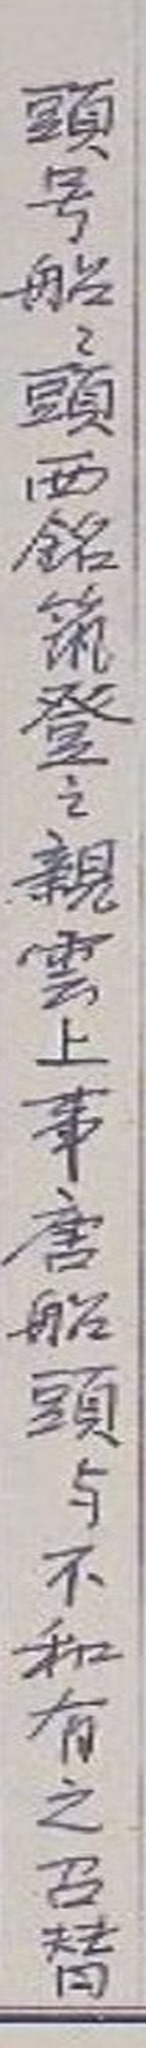頭号船々頭西銘筑登之親雲上事唐船頭と不和有之召替
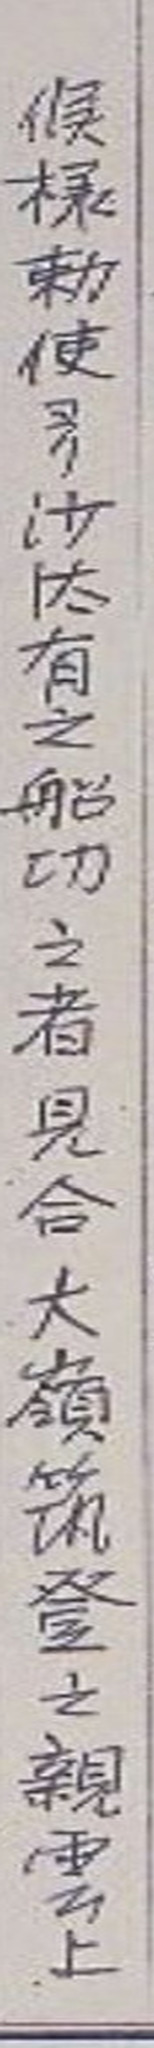候様勅使より沙汰有之船功之者見合大嶺筑登親雲上
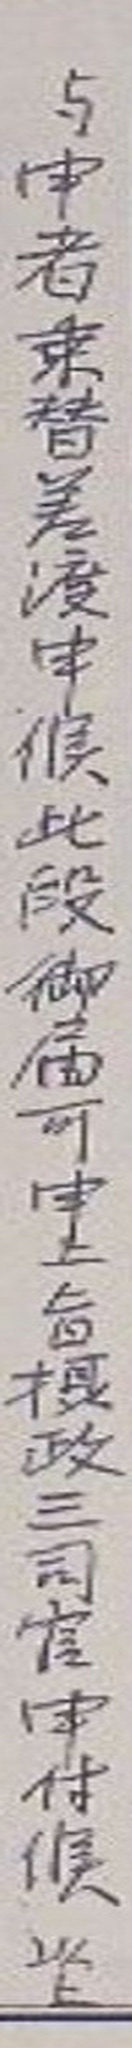と申者乗替差渡申候此段御届可申上旨摂政三司官申付候以上

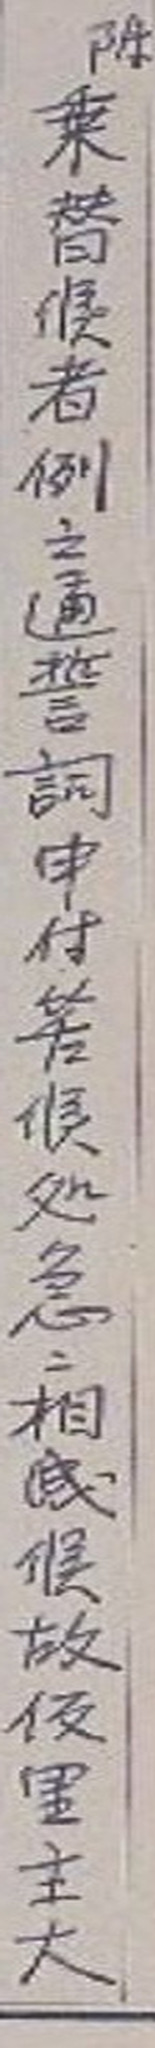乗替候者例之通誓詞申付筈候処急に相成候故仮里主大
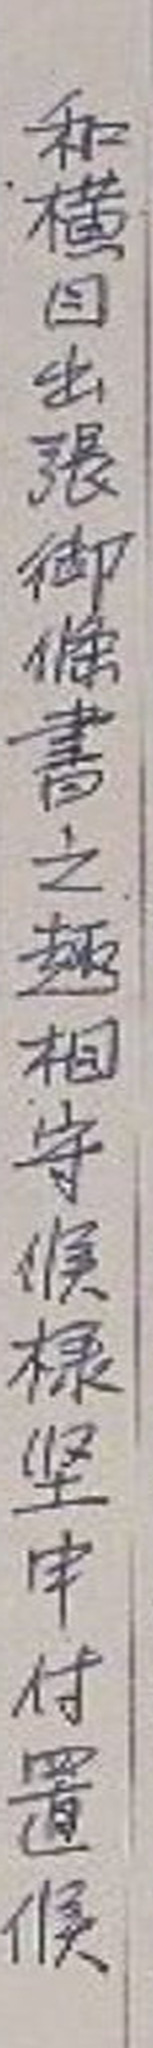和横目出張御条書之趣相守候様堅申付置候
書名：支那冊封使来琉諸記 下巻
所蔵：University of the Ryukyus Library
